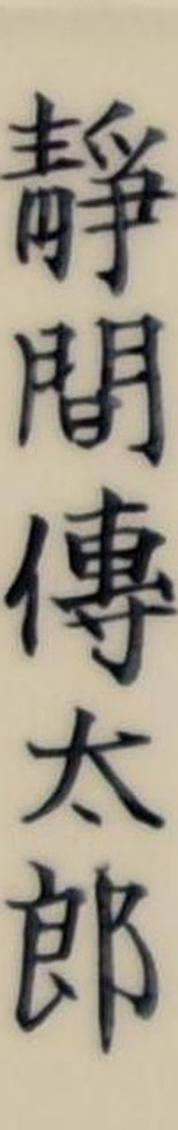静間傳太郎
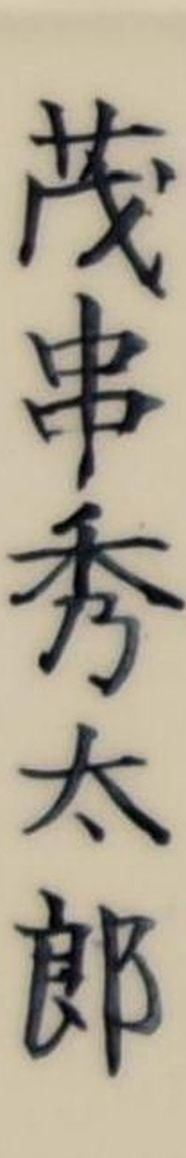茂串秀太郎
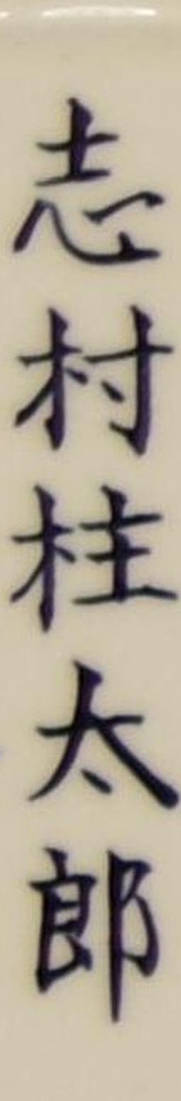志村桂太郎

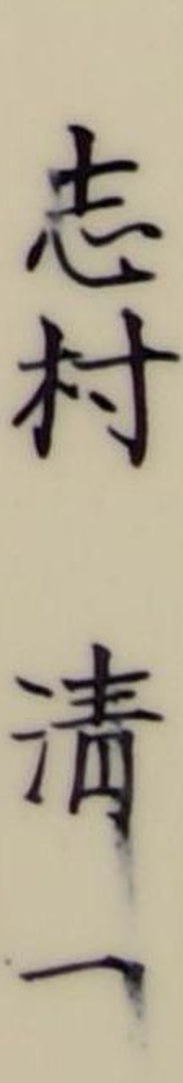志村清一
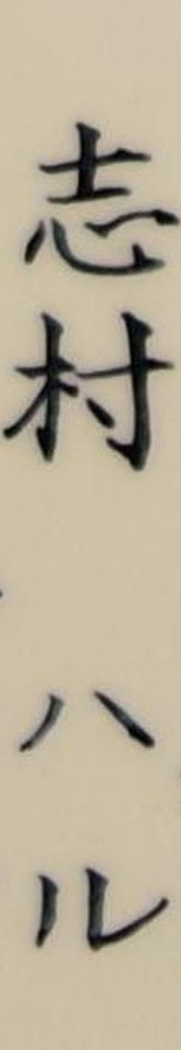志村ハル
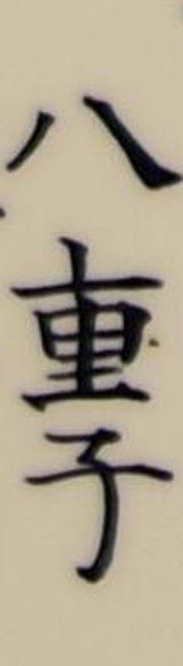八重子
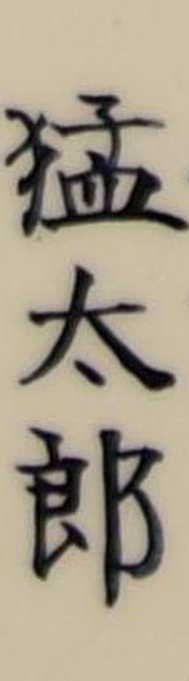猛太郎
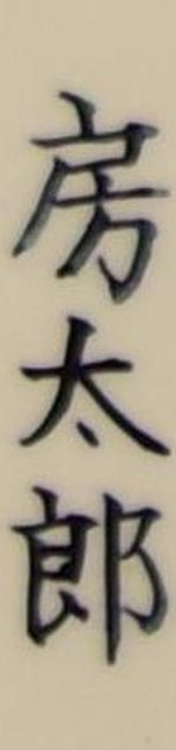房太郎
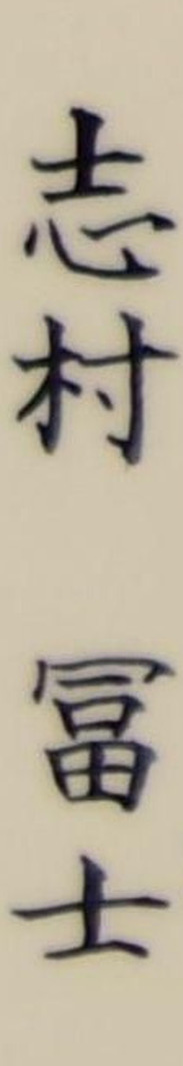志村冨士
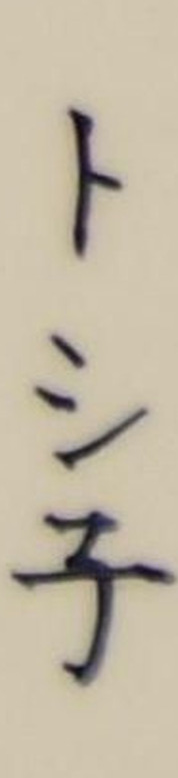トシ子

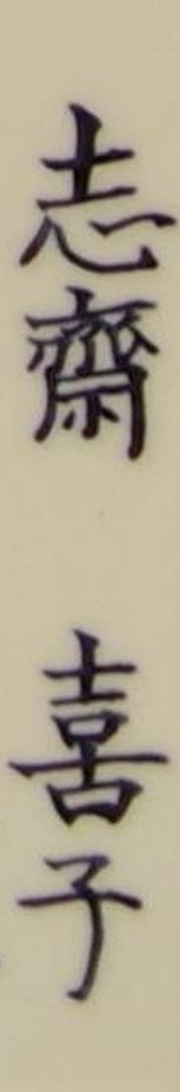志斎喜子
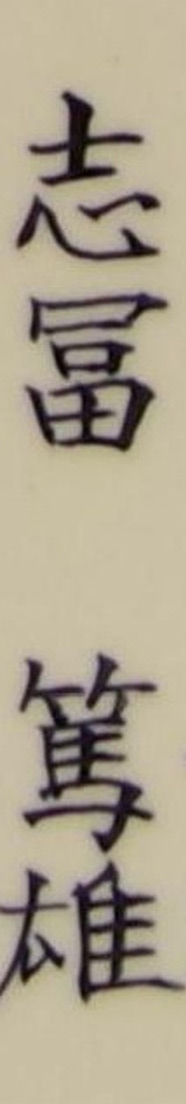志冨篤雄
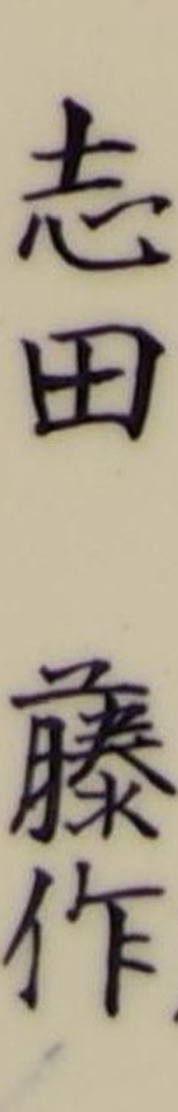志田藤作
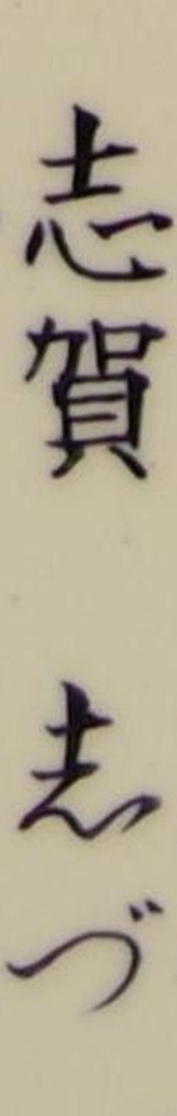志賀しづ
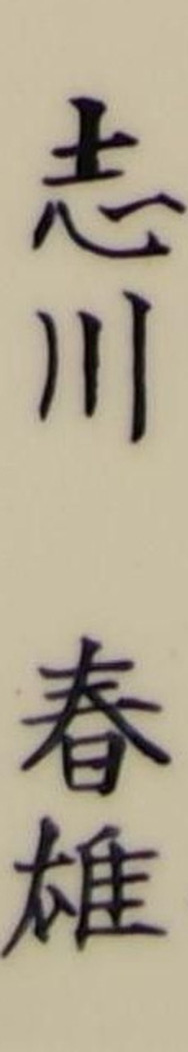志川春雄
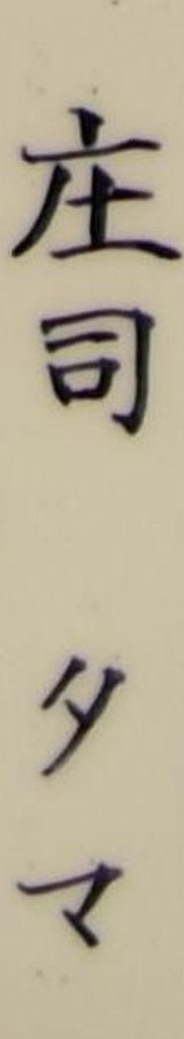庄司タマ
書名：A~D
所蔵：koyasan kongobuji
